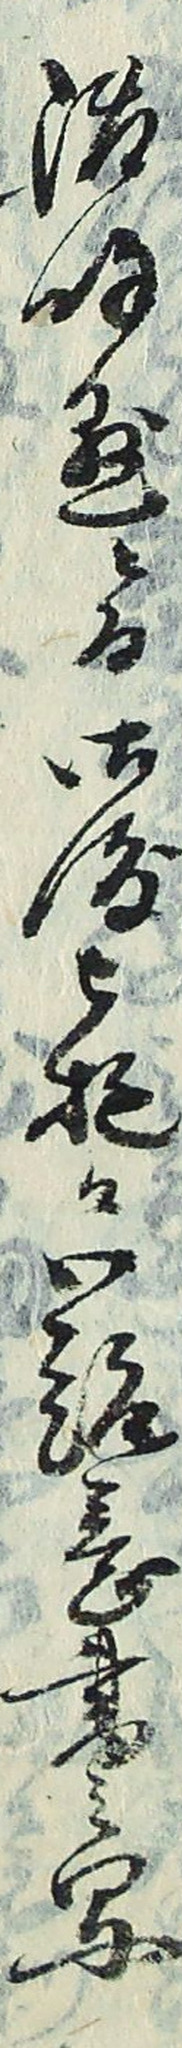御呼懸ニ而御渡被遊候御趣意書之写
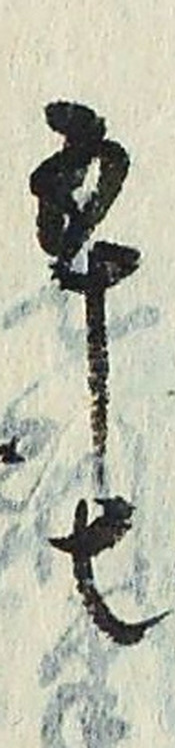五十七
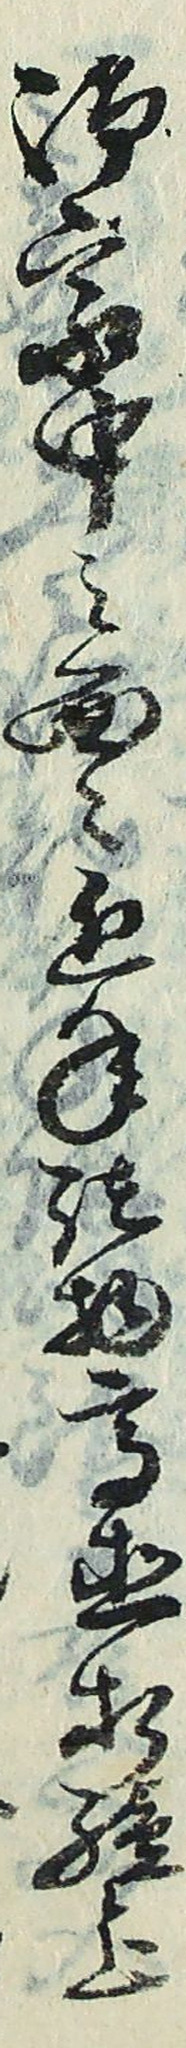御家中之面々近年諸物高直打續候上
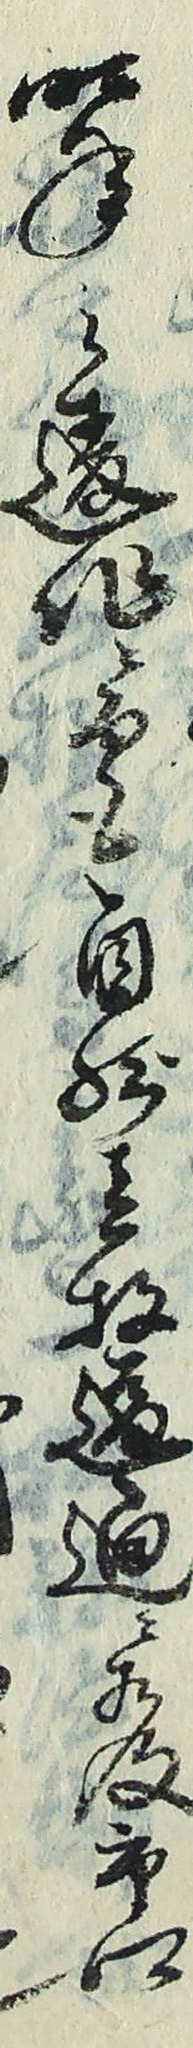昨年之違作ニ而も自然壱牧逼迫ニ相及市郷
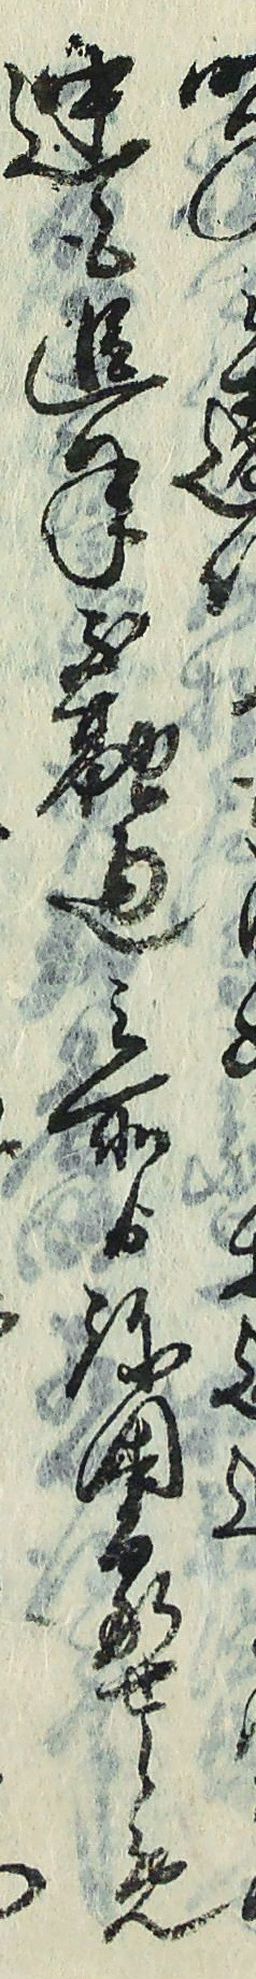迚も追年不融通之所ゟ弥困窮せしめ
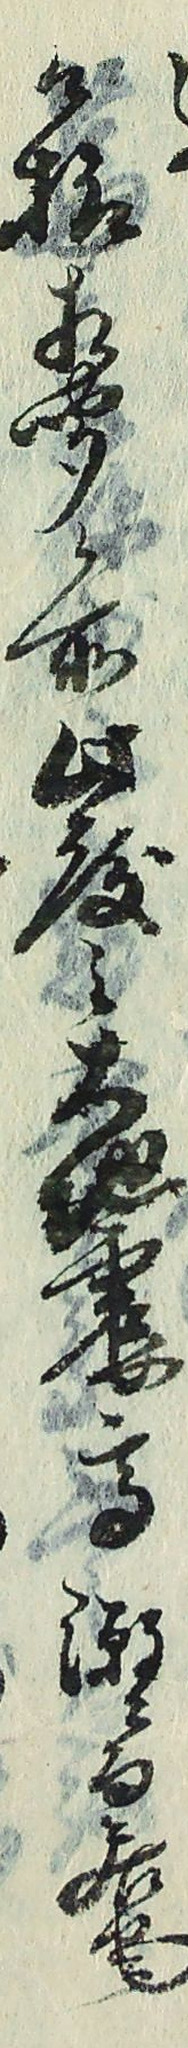候様相聞候所此度之大地震高潮ニ而居宅
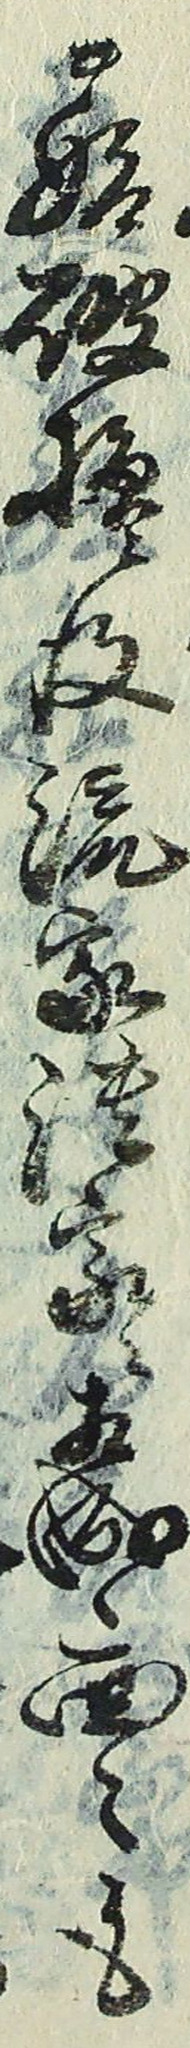ヲ始破損ニ及流家潰家ニ相成候面々も
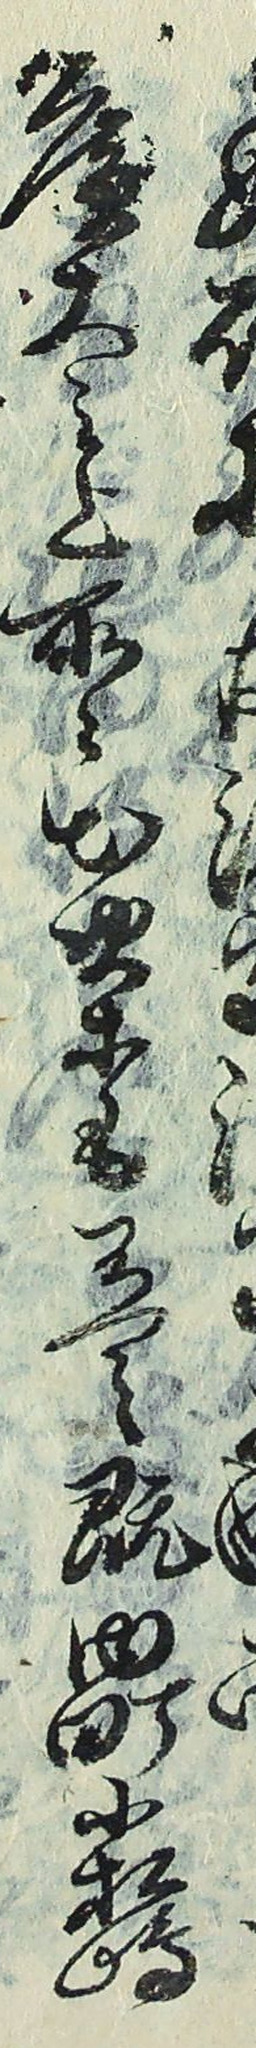廣大之上所々出火等も有之既内町小松嶋
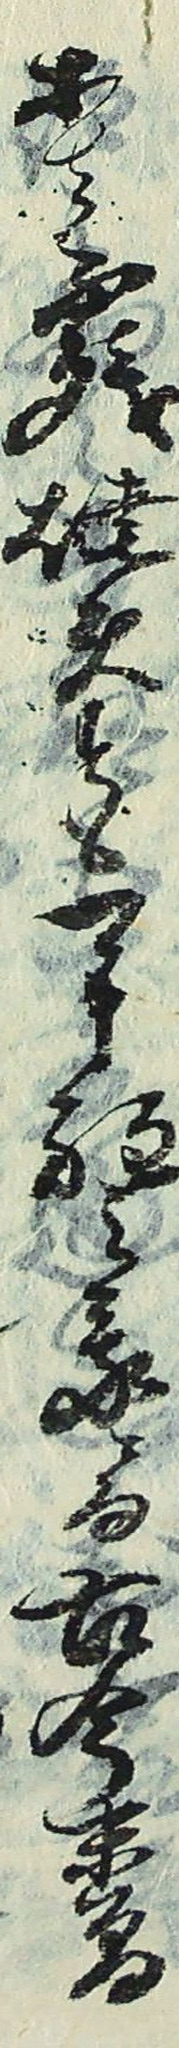等者不残焼失とも可申程之義ニ而古今未曾
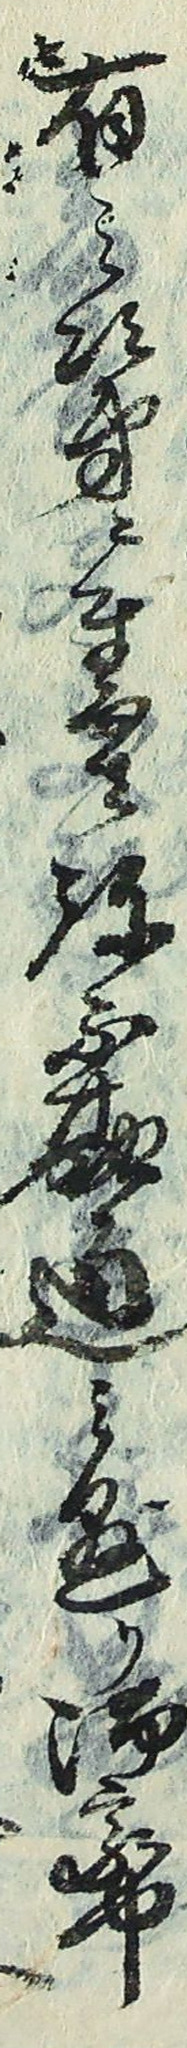有之次第ニ付而ハ弥不融通之懸り御家中
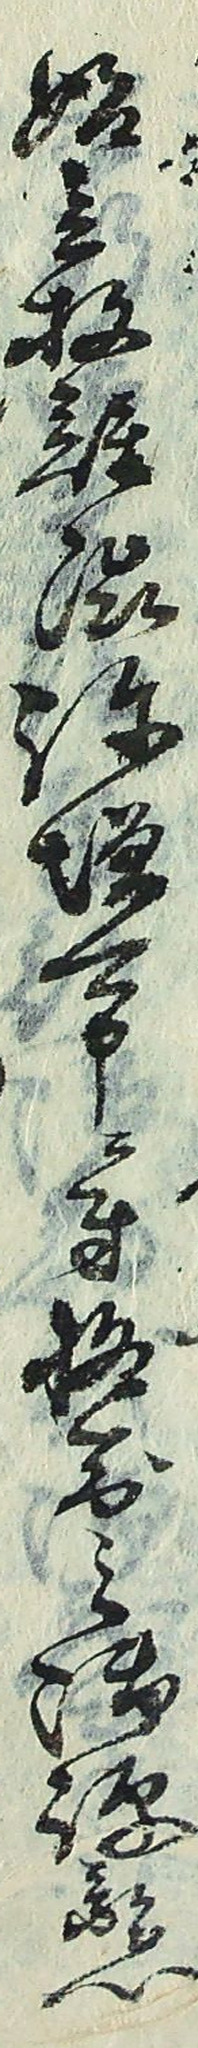始壱牧難渋弥増可申ニ付格別之御評義ヲ以
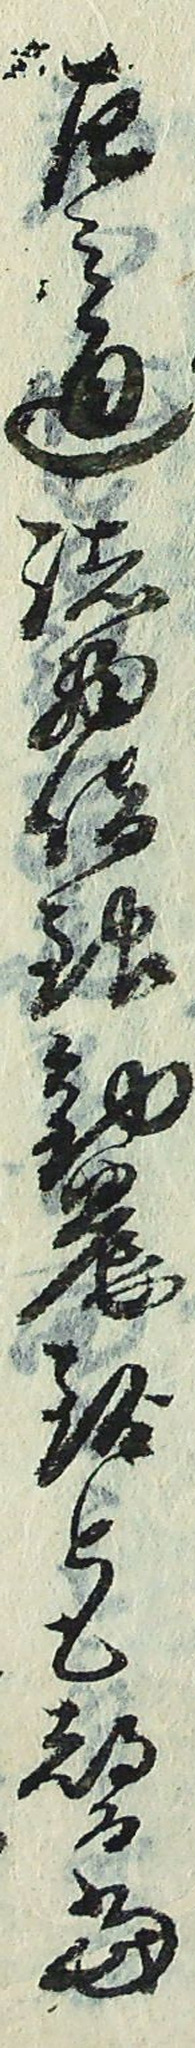左之通諸拝借銀勧農趣とも都而當
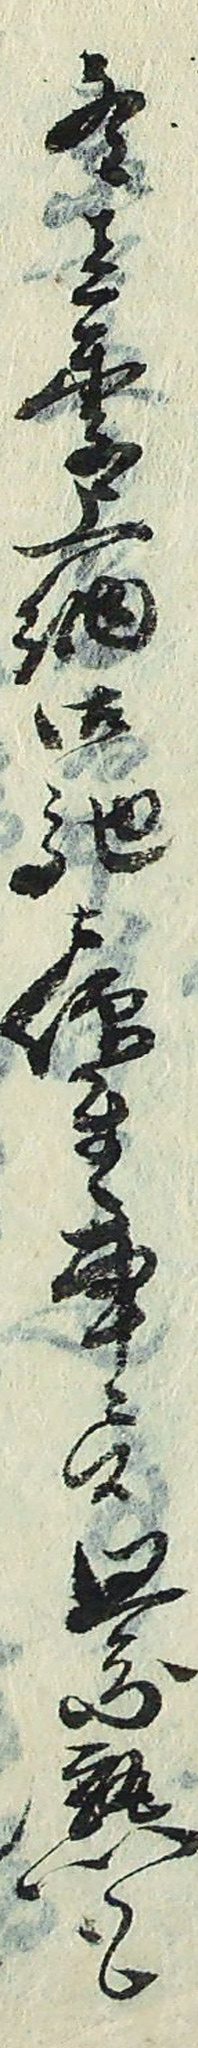冬壱季上納御馳被仰付候事ニ候且亦孰も
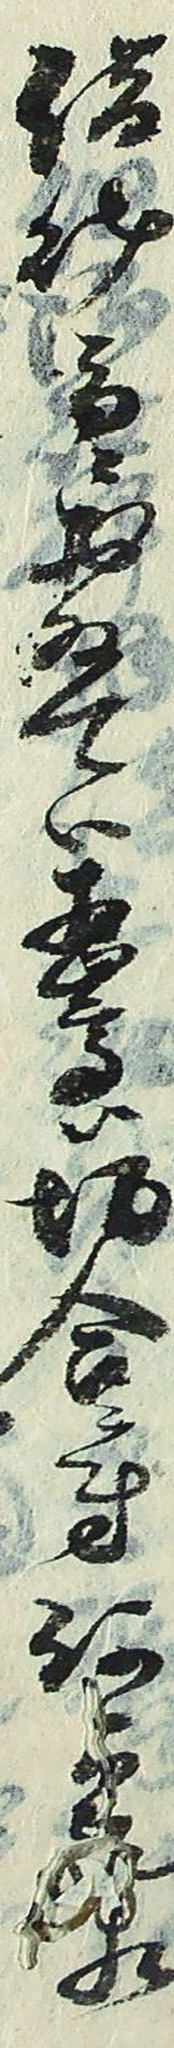借財方ニおゐてハ相嵩候場合ニ付何と歟相
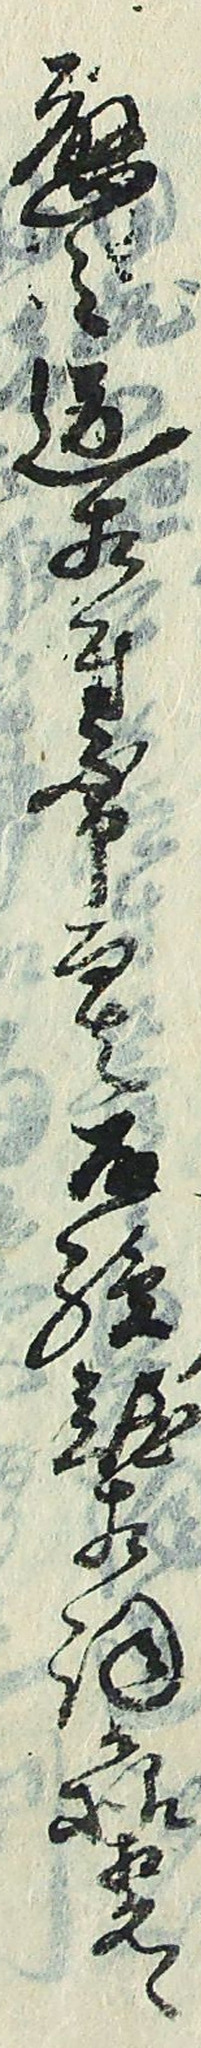應之道相付不申而者取續難相調候様相見候
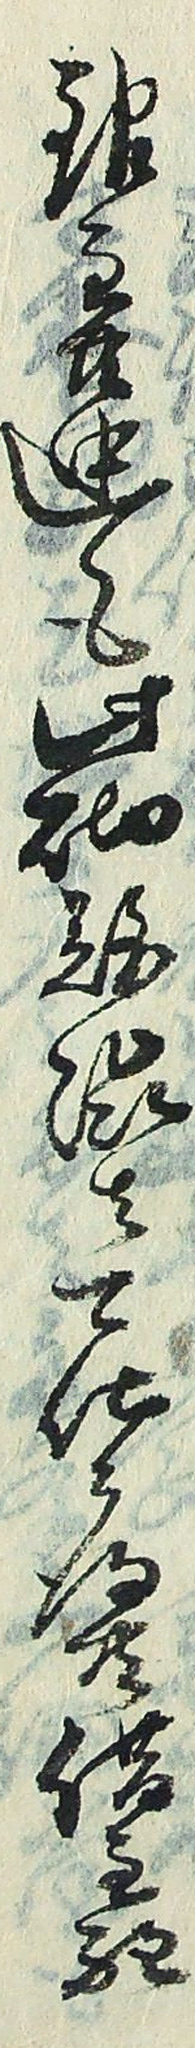銀主共迚も此砌難渋者可仕候得共借主程
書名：諸御趣意書并御下知向之写
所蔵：鳴門教育大学 Naruto University of Education
